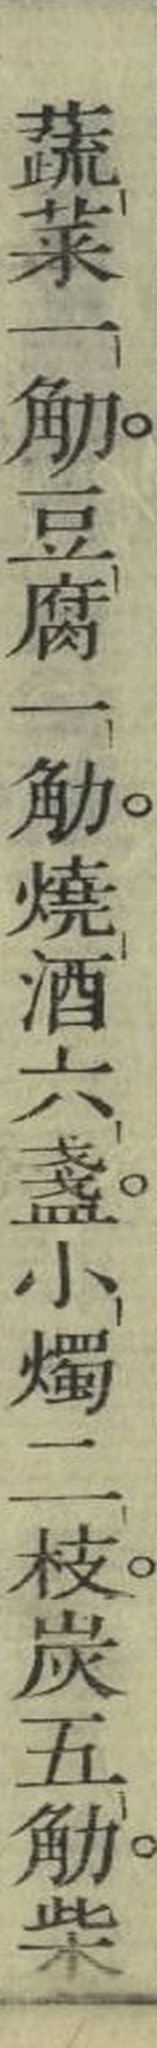蔬-菜一-觔。豆-腐一-觔。焼-酒六-盞。小-燭二-枝。炭五-觔。柴
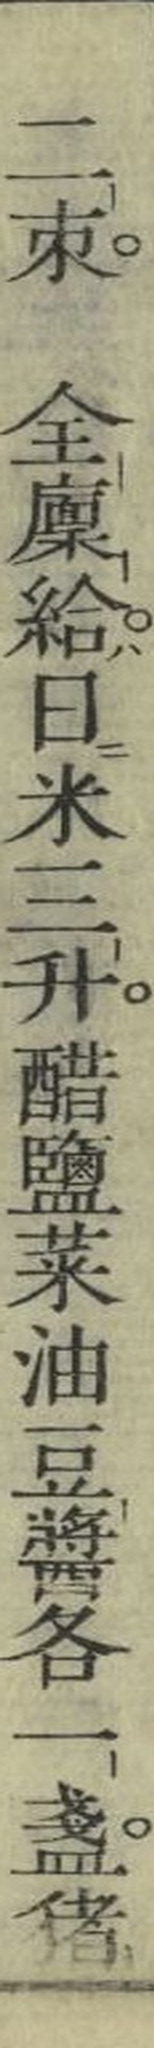二-束。全-廩-給。日米三-升。醋塩菜油豆-醬各一-盞。猪-
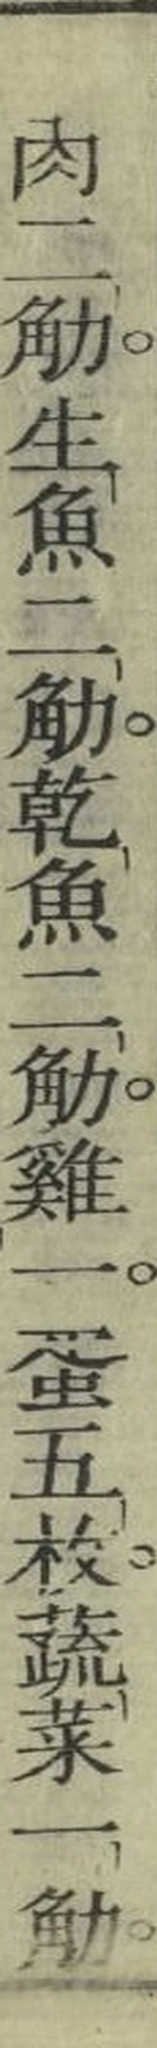肉二-觔。生-魚二-觔。乾-魚二-觔。鶏-一。蛋五-枚。蔬-菜一-觔。
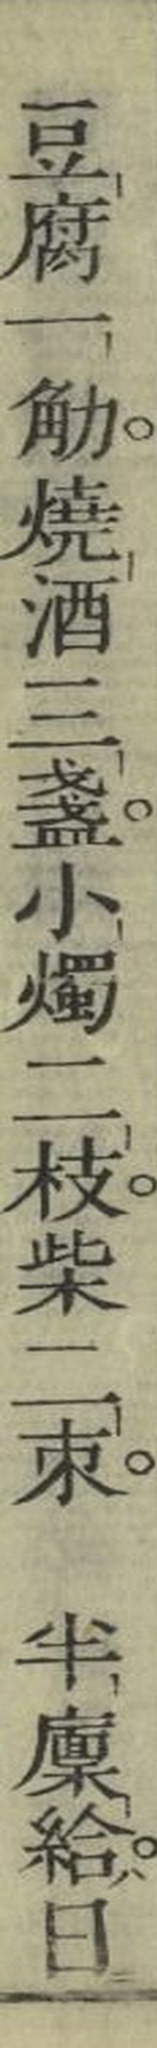豆-腐一-觔。焼-酒三-盞。小-燭二-枝。柴二-束。半-廩-給。日
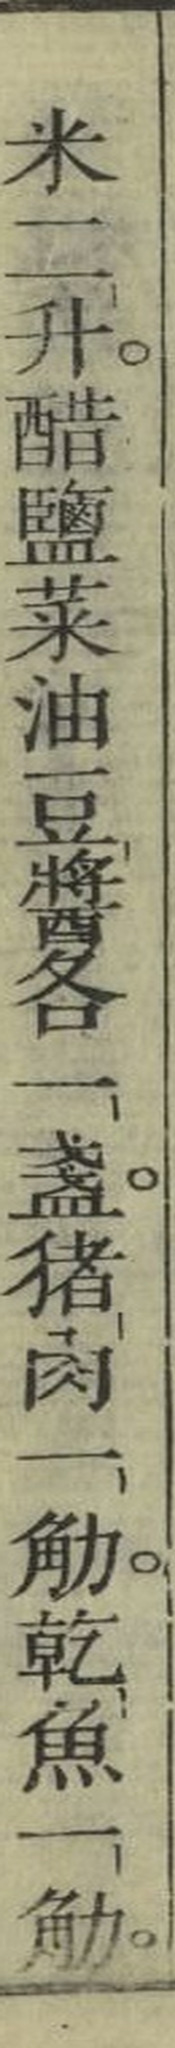米二-升。醋塩菜油豆-醬各一-盞。猪-肉一-觔。乾-魚一-觔。
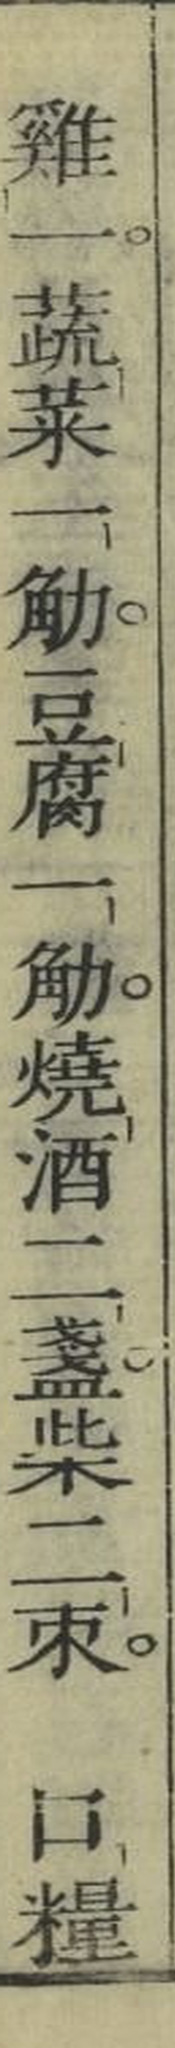鶏-一。蔬-菜一-觔。豆-腐一-觔。焼-酒二-盞。柴二-束。口-糧
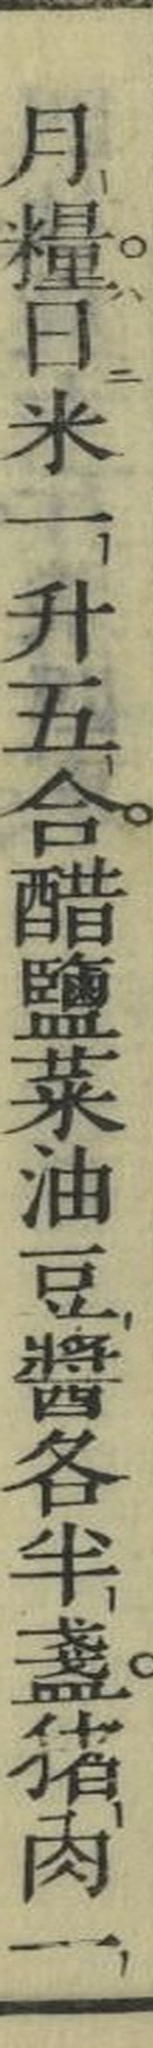月-糧。日米一-升五-合。醋塩菜油豆-醬各半-盞。猪-肉一-
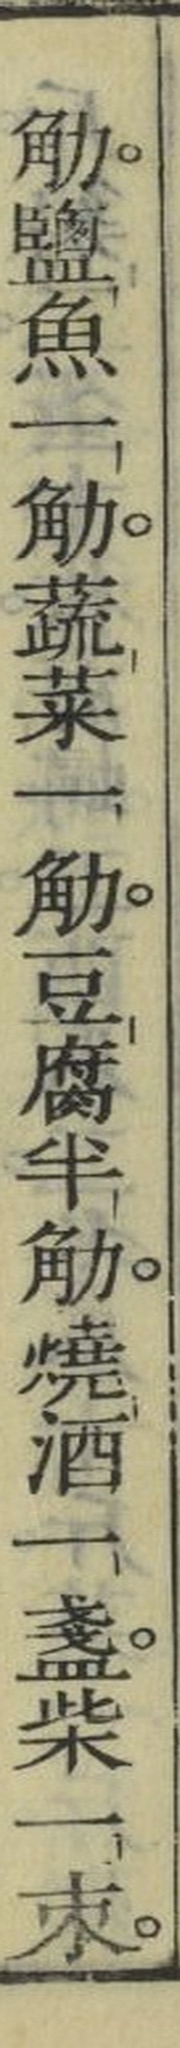觔。塩-魚一-觔。蔬-菜一-觔。豆-腐半-觔。焼-酒一-盞。柴一-束。
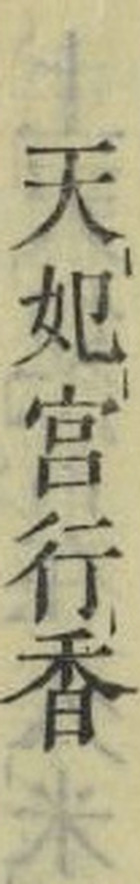天-妃-宮行-香
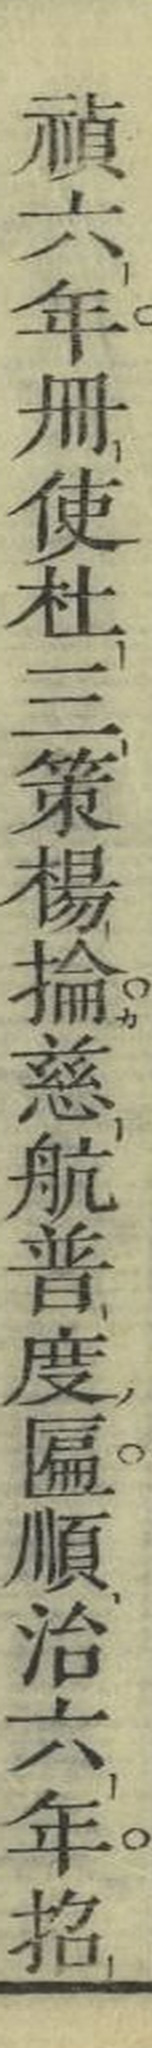禎六-年。冊-使杜-三-策楊-掄。慈-航普-度匾。順-治六-年。招-
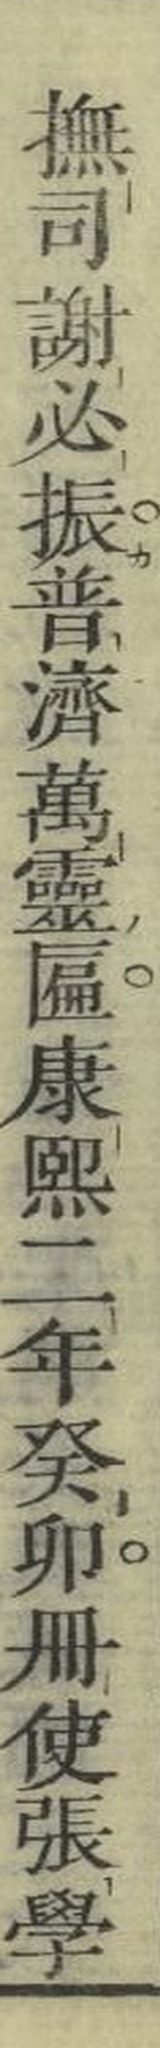撫-司謝-必-振。普-済万-霊匾。康-熙二-年癸-卯。冊使張-学

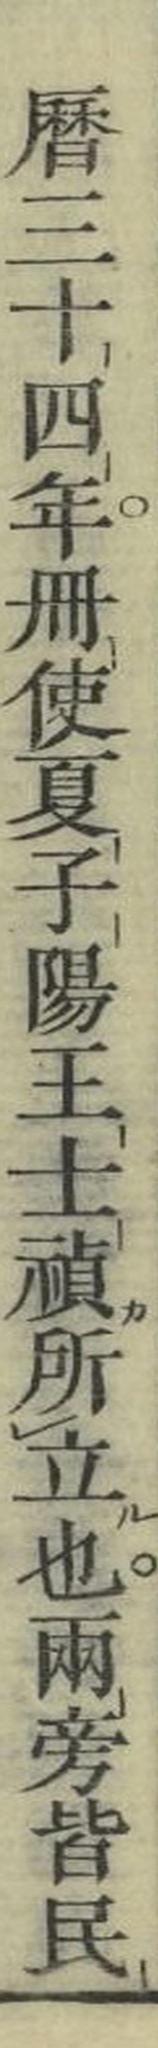暦三十-四-年。冊-使夏-子-陽王-士-禎所立也。両-旁皆民-
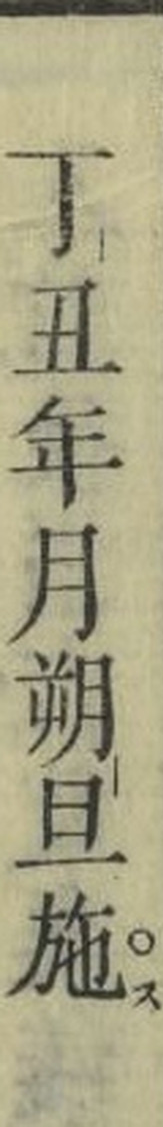丁-丑年月朔-旦施。
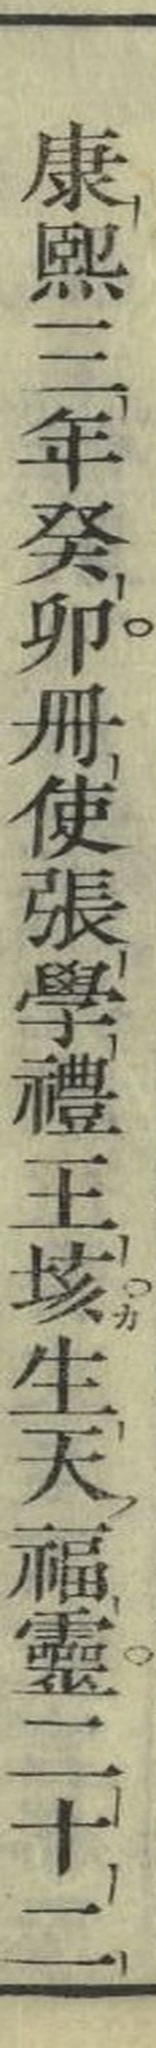康-熙三-年癸-卯。冊-使張-学-礼王-垓。生-天福-霊。二-十-二-

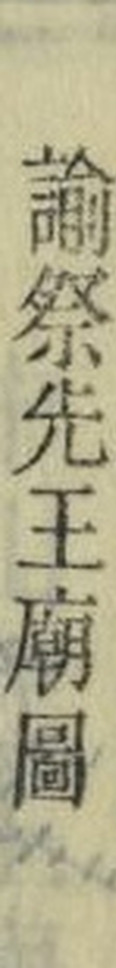諭祭先王廟図

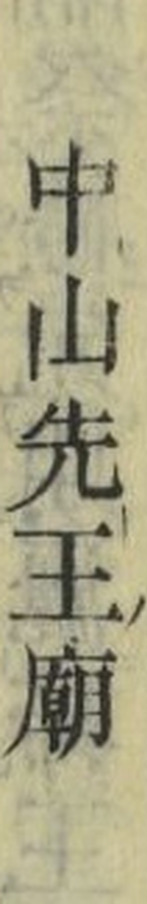中-山先-王廟
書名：中山伝信録 巻二
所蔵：University of the Ryukyus Library
